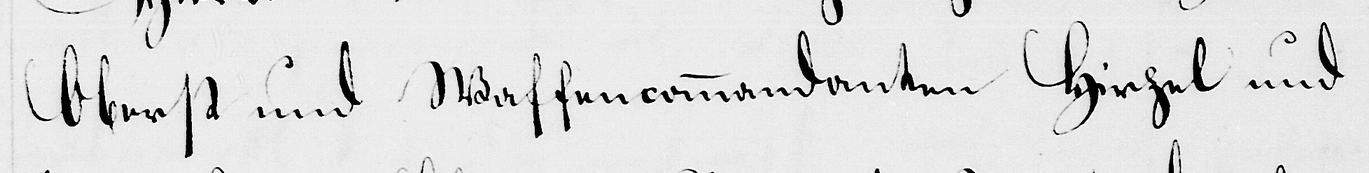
Oberst und Waffencommandanten Hirzel und
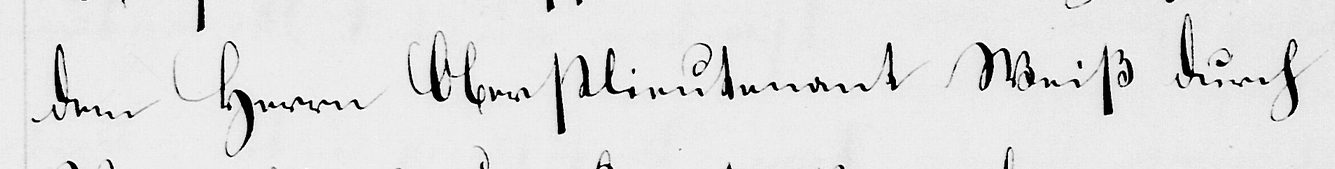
dem Herrn Oberstlieutenant Weiß durch
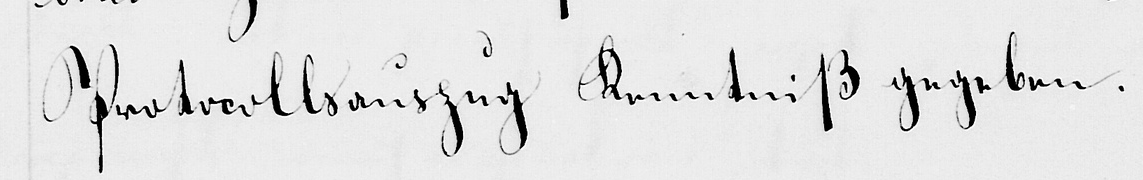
Protocollsauszug Kenntniß gegeben.
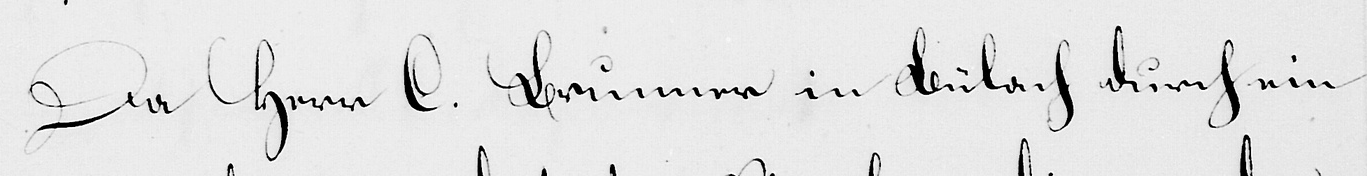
Da Herr C. Brunner in Bülach durch ein
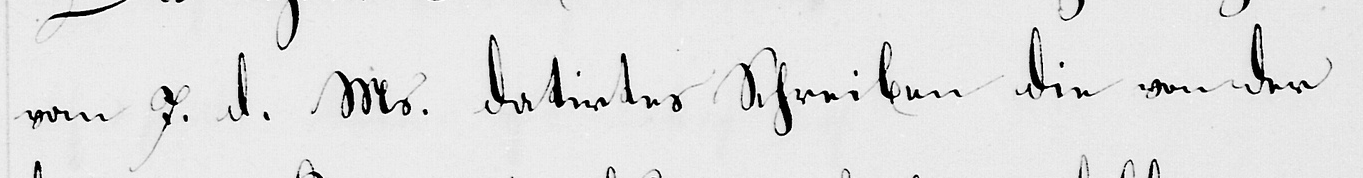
vom 7. d. Ms. datirtes Schreiben die von der
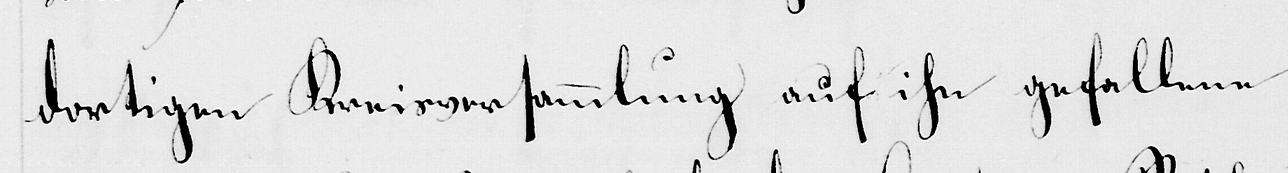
dortigen Kreisversammlung auf ihn gefallene
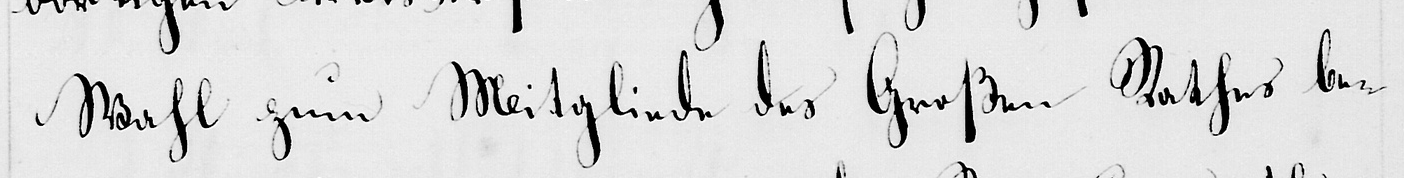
Wahl zum Mitglied des Großen Rathes be¬
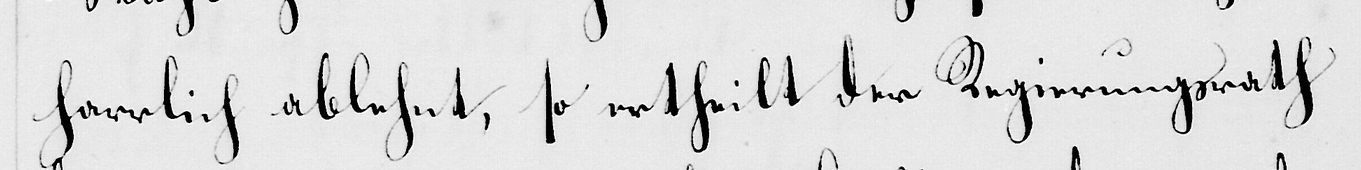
harrlich ablehnt, so ertheilt der Regierungsrath
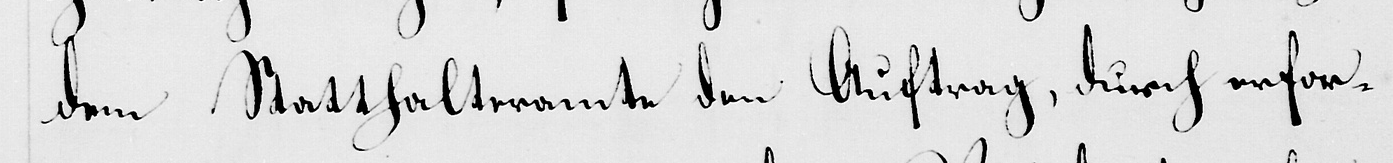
dem Statthalteramte den Auftrag, durch erfor¬
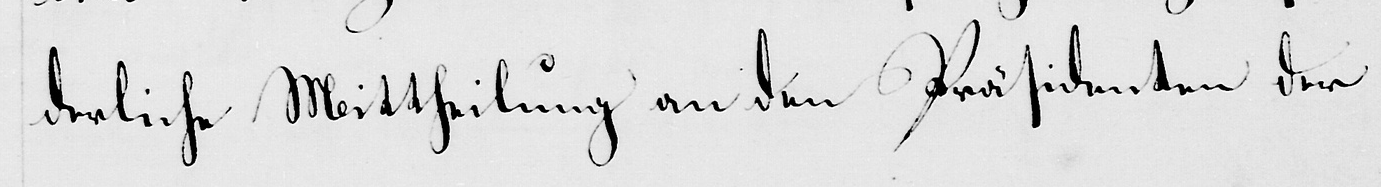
derliche Mittheilung an den Präsidenten der
